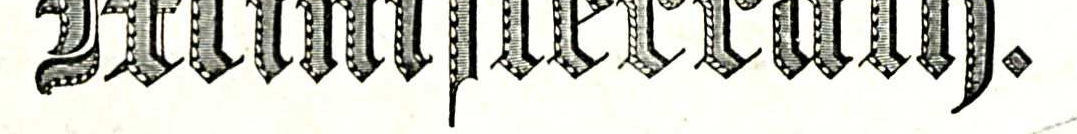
Ministerrath
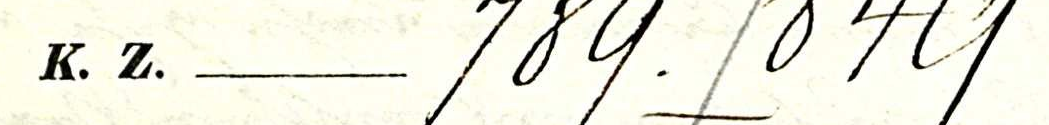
KZ 789/[1]849
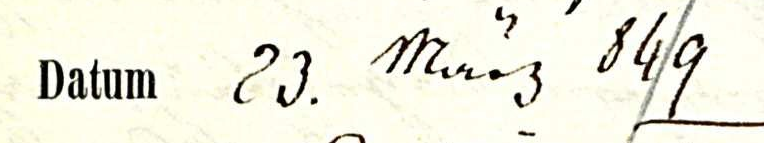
Datum 23. März [1]849
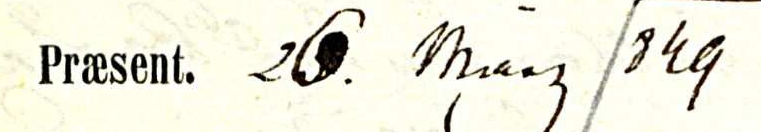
Praesent. 26. März [1]849
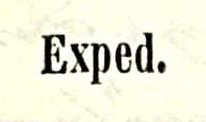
Exped.
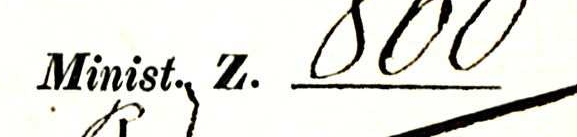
Minist. Z. 860
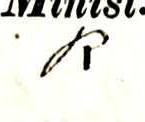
R.
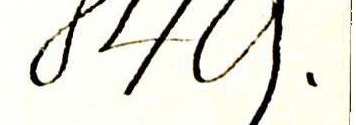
849
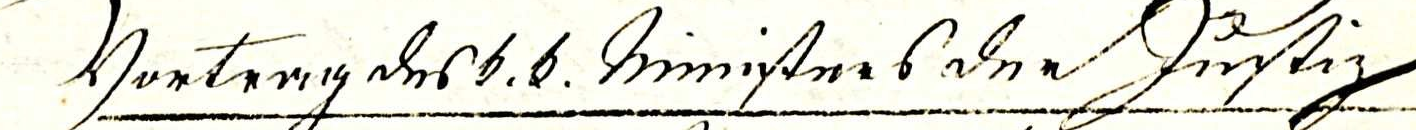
Vortrag des kk Ministers der Justiz
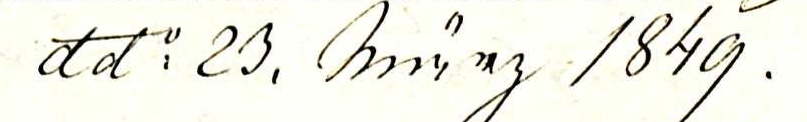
Ddo 23. März 1849
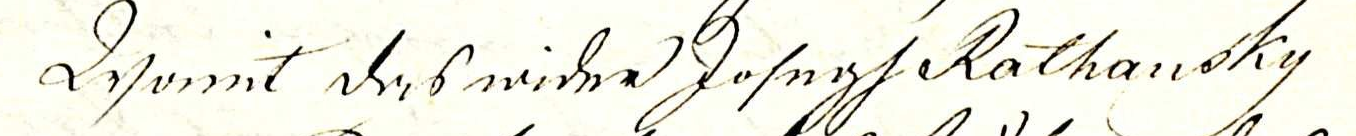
Womit das wider Joseph Rathausky
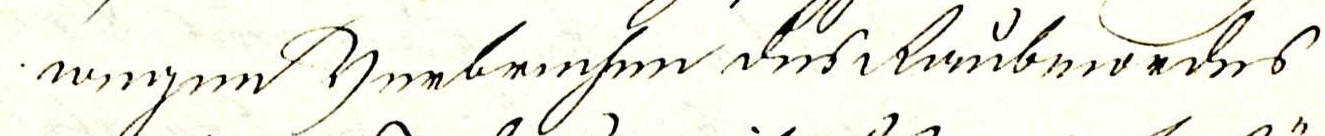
wegen Verbrechen des Raubmordes
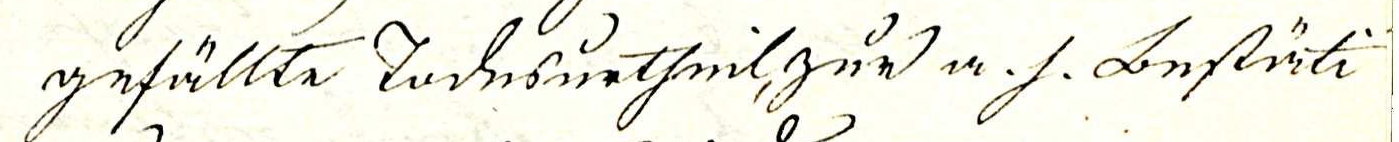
gefällte Todesurtheil zur a.h. Bestäti¬
